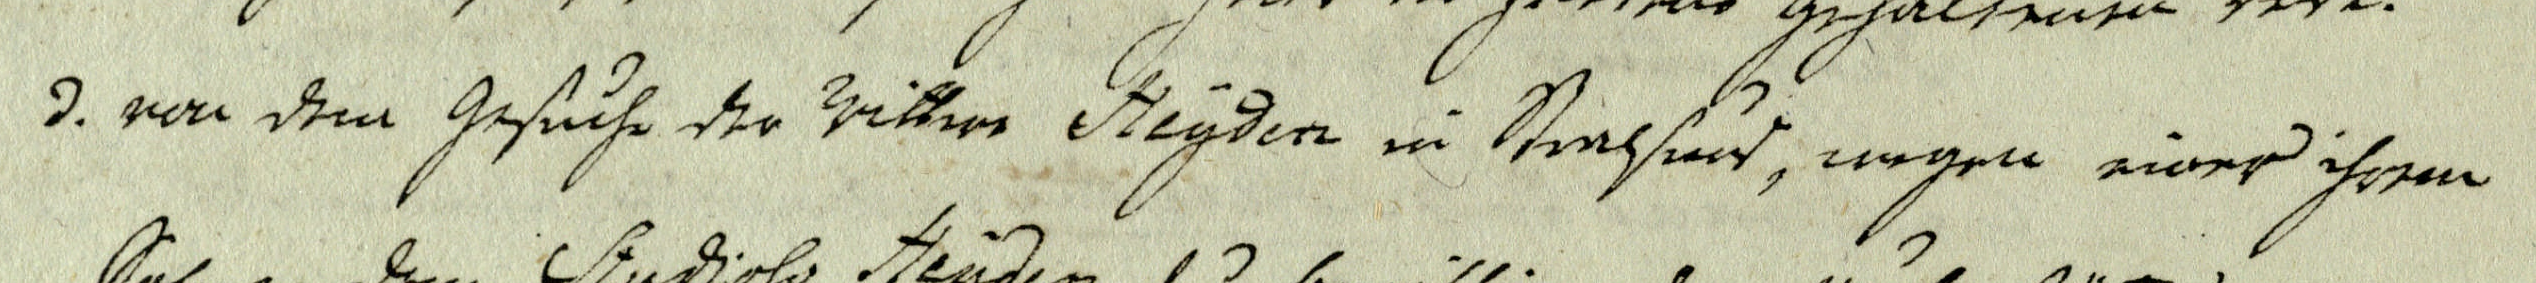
d. von dem Gesuche der Wittwe Heÿden in Stralsund, wegen einer ihrem
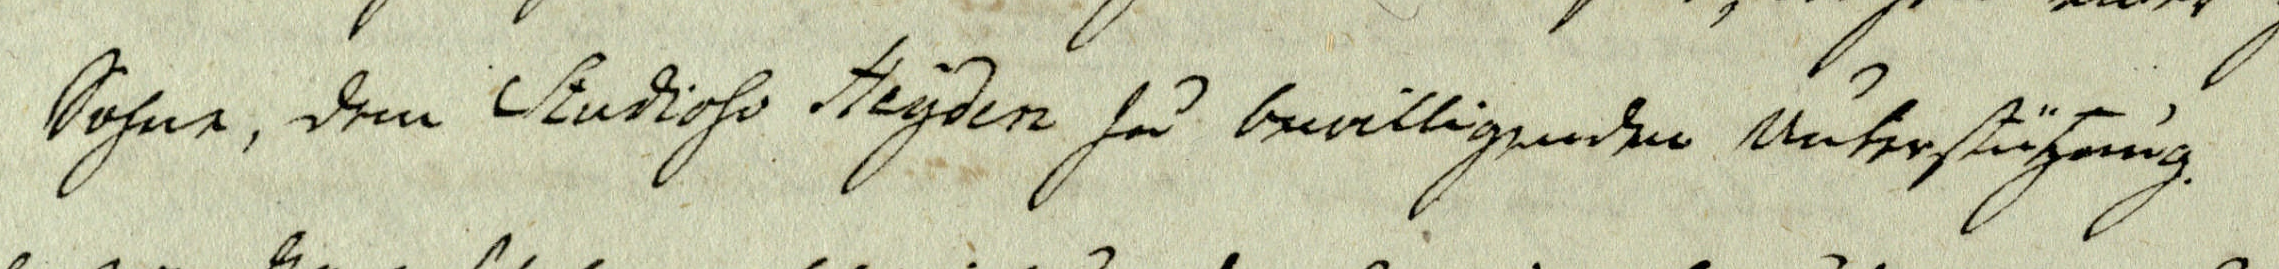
Sohne, dem Studioso Heÿden zu bewilligenden Unterstützung.
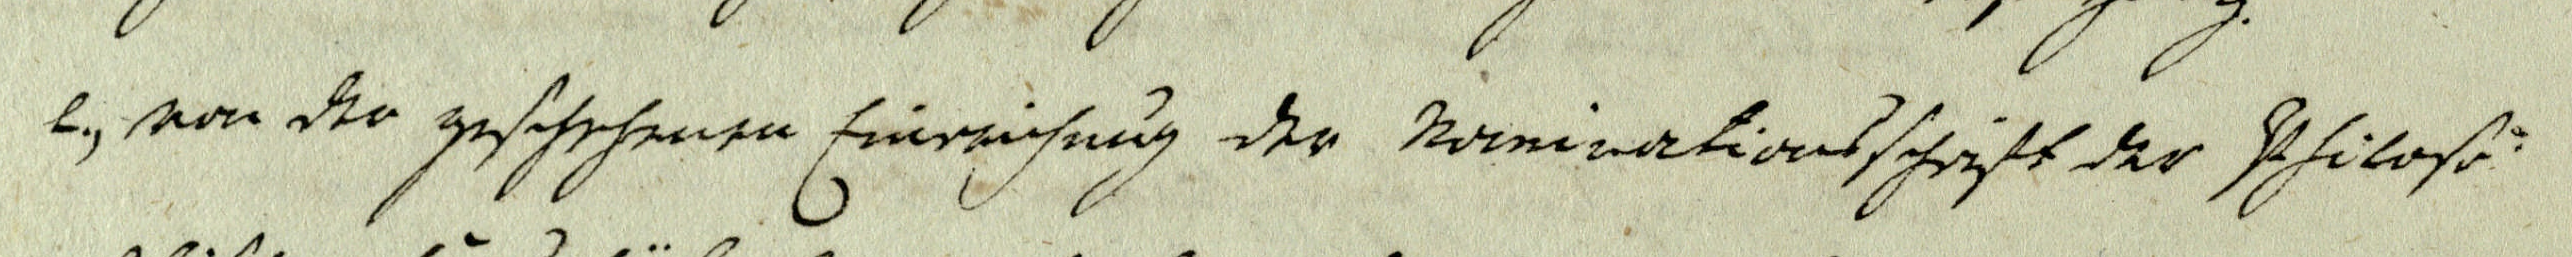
e, von der geschehenen Einreichung der Nominationsschrift der Philoso¬
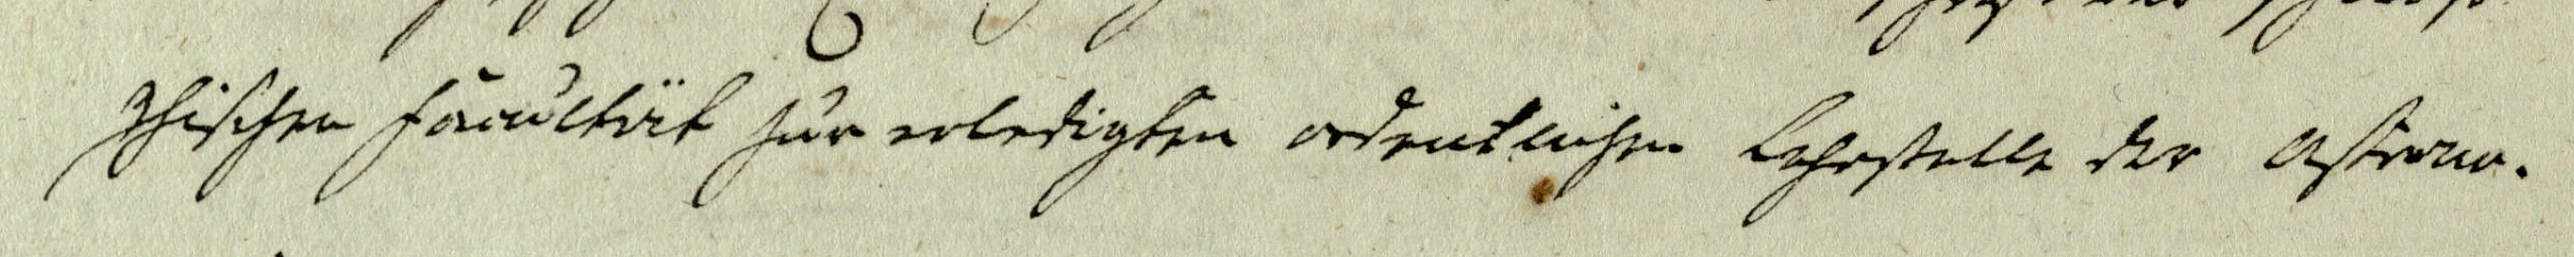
phischen Facultät zur erledigten ordentlichen Lehrstelle der Astrono¬
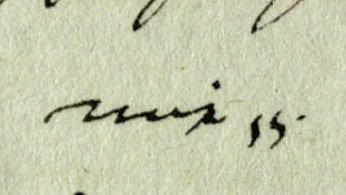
mie.
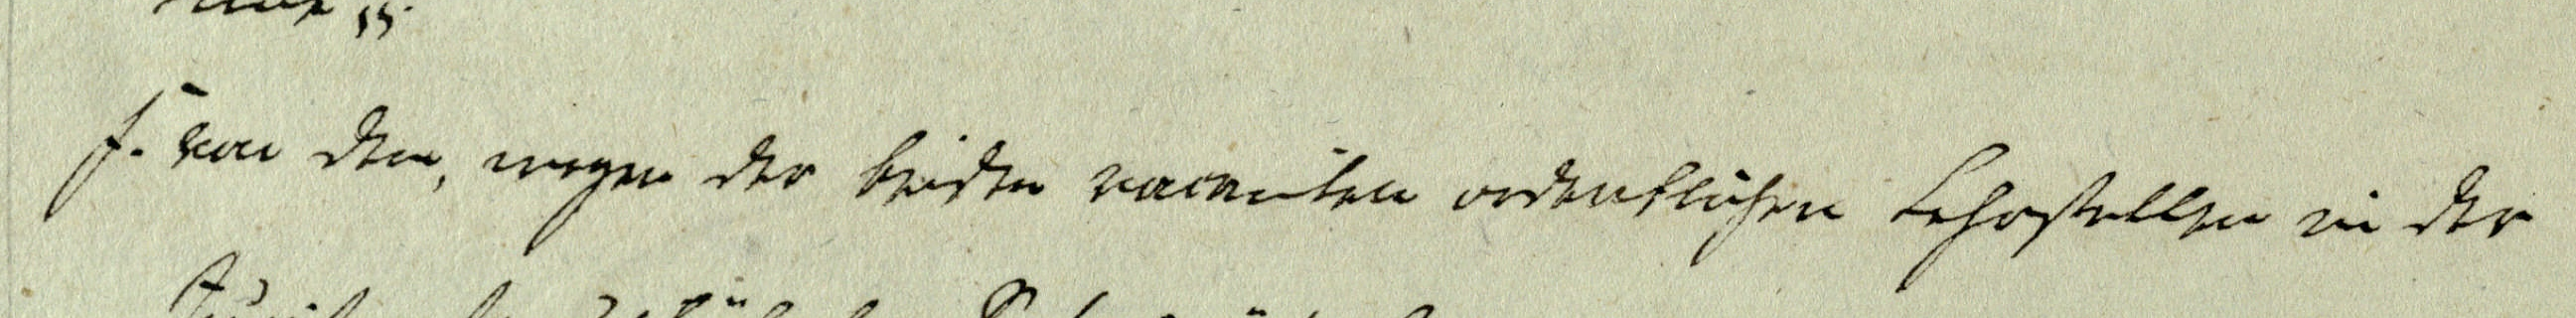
f. von dem, wegen der beiden vacanten ordentlichen Lehrstellen in der
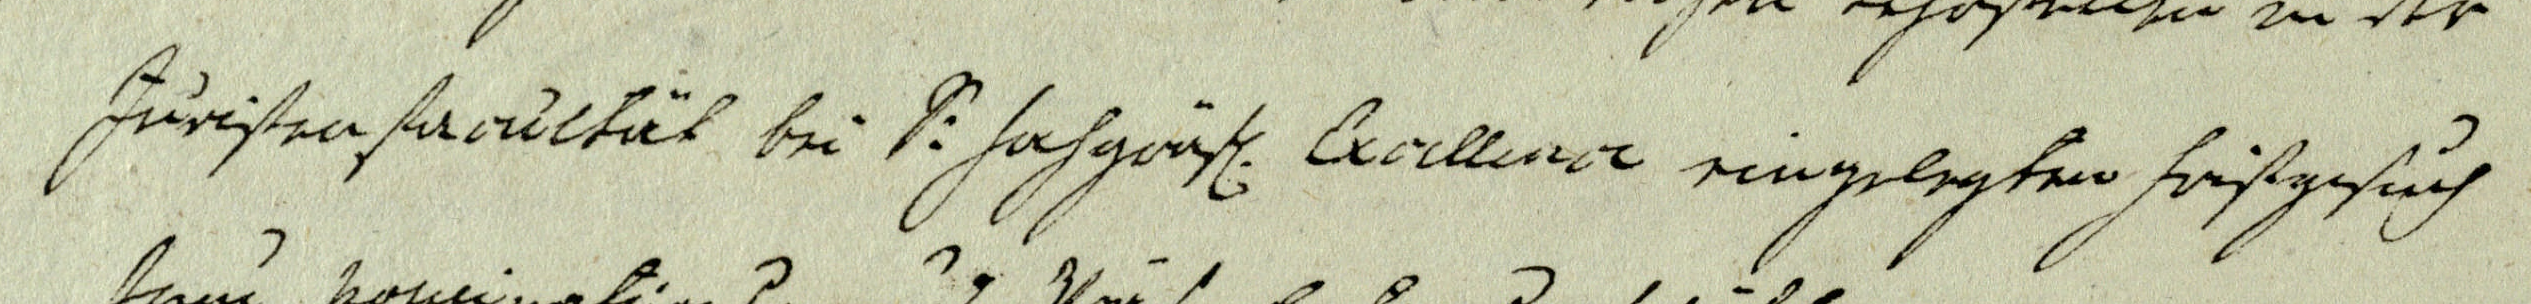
Juristenfacultät bei Sr Hochgräfl. Excellence eingelegten Fristgesuch
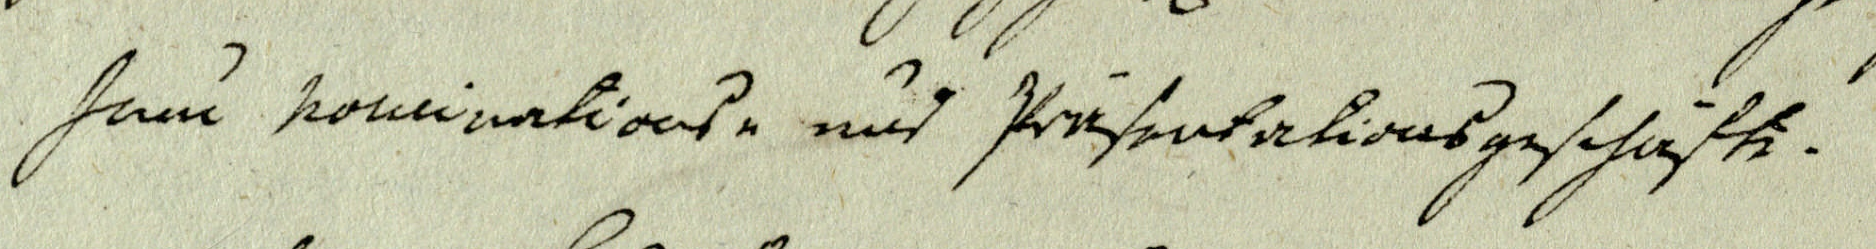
zum Nominations- und Präsentationsgeschäfte.
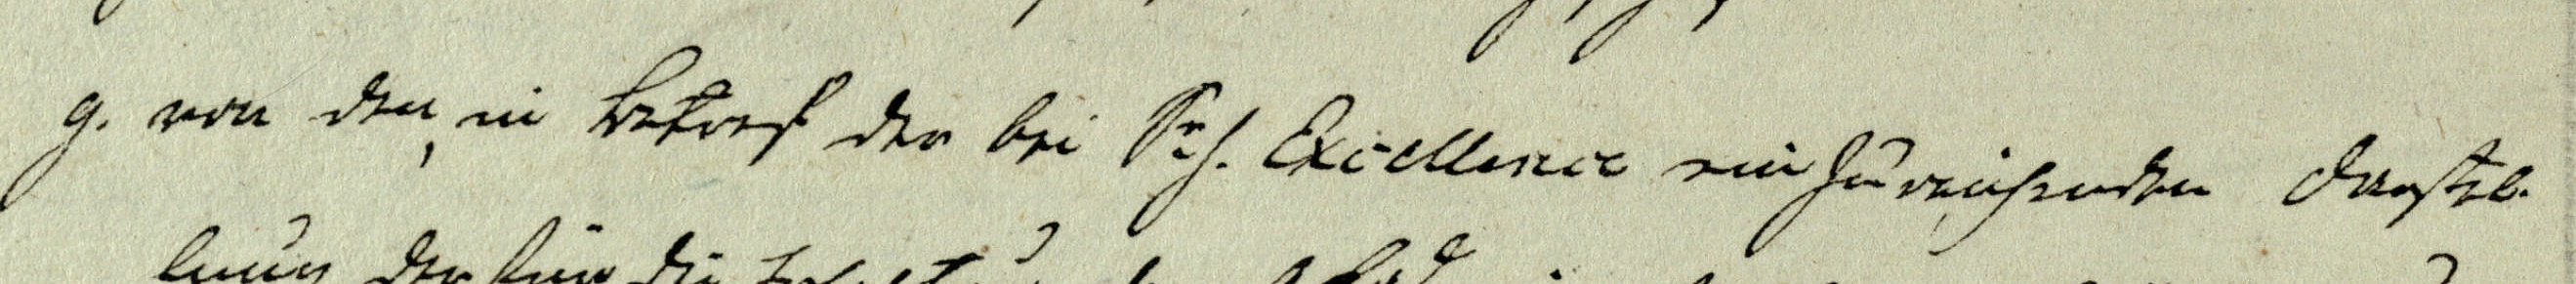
g. von den, in Betref der bei Sr. h. Excellence einzureichenden Darstel¬
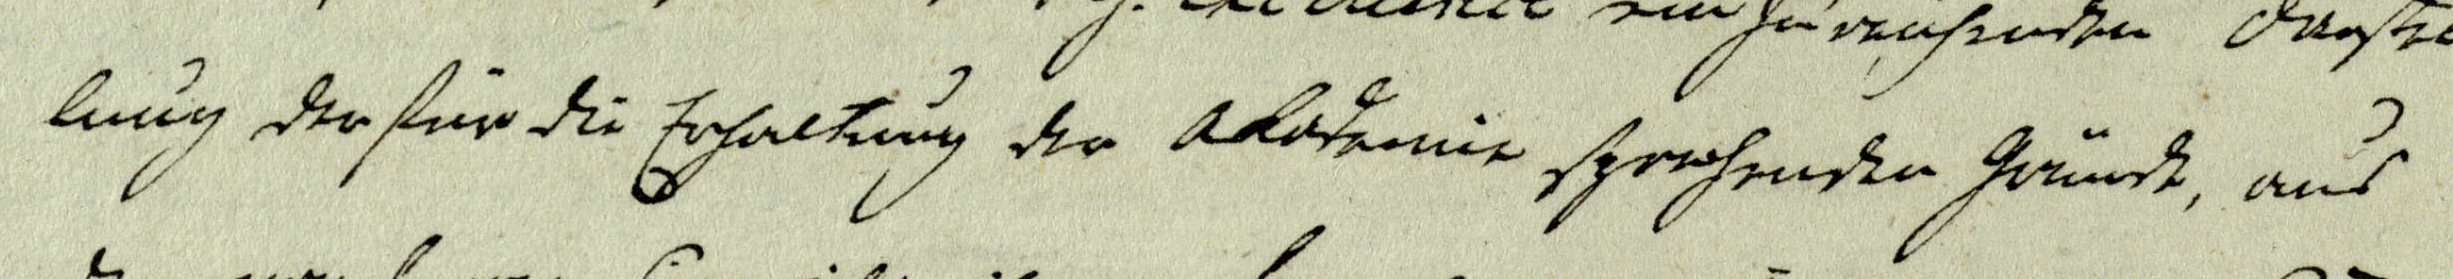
lung der für die Erhaltung der Akademie sprechenden Gründe, aus
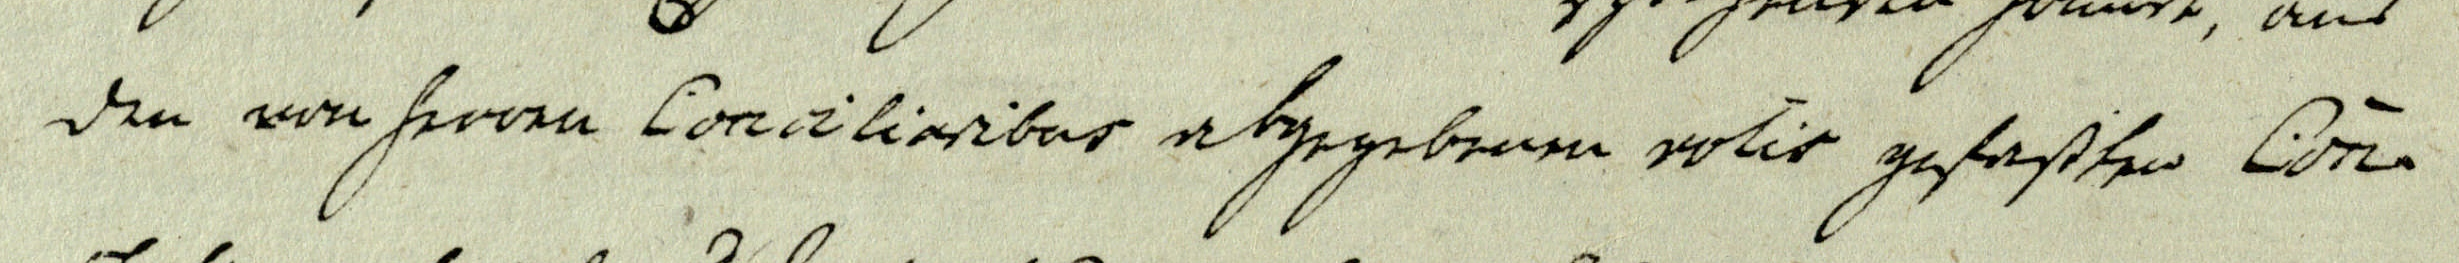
den von Herren Conciliaribus abgegebenen votis gefaßten Con¬
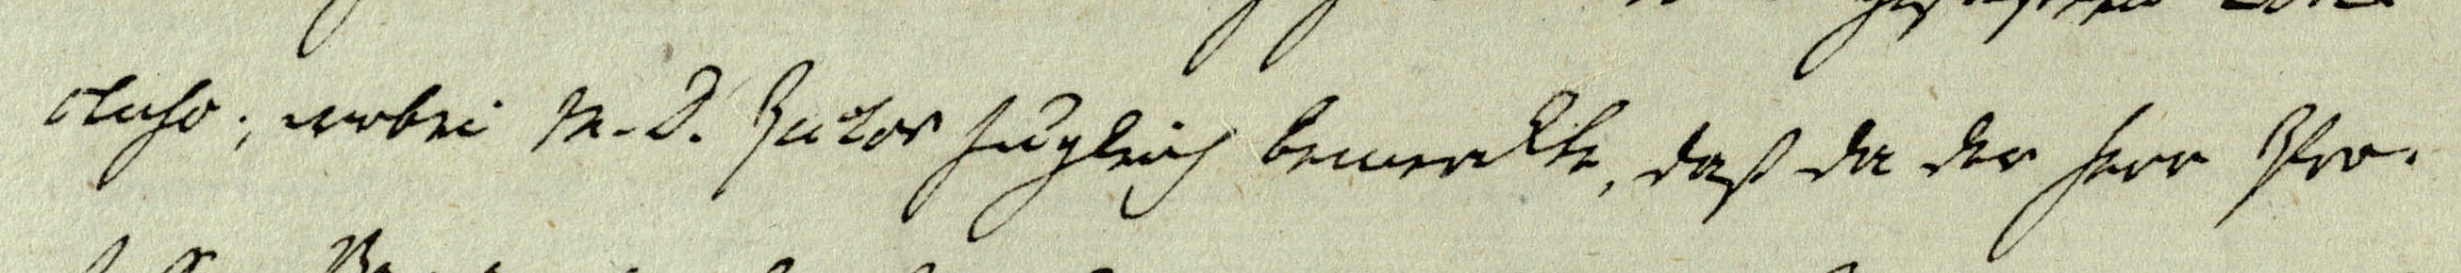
cluso; wobei M. D. Rector zugleich bemerkte, daß da der Herr Prof¬
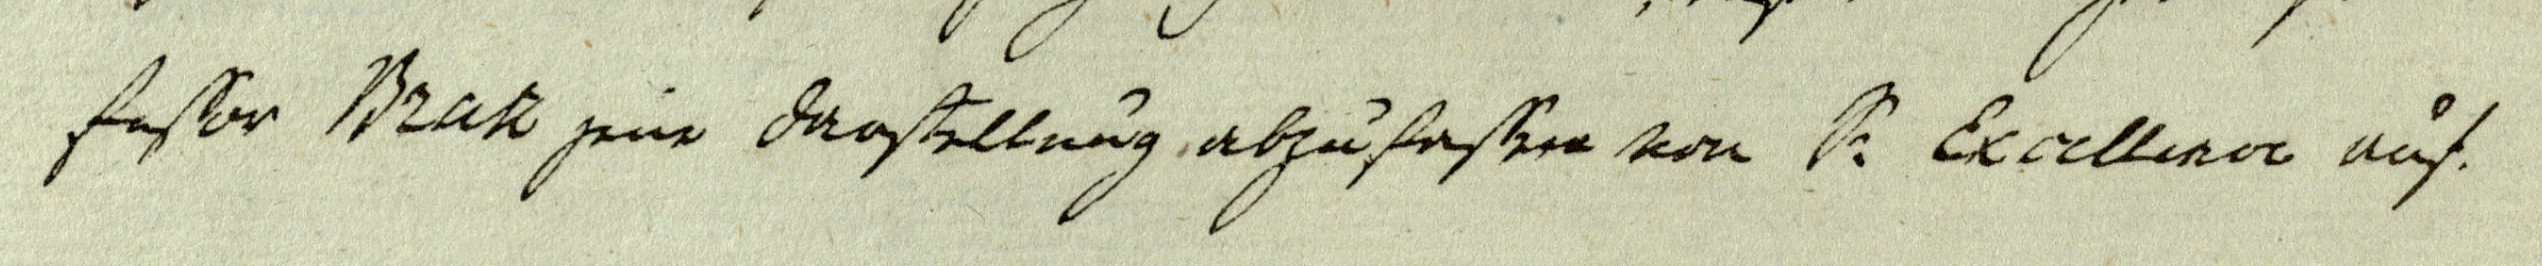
fessor Bratt seine Darstellung abzufassen von Sr Excellence auf¬
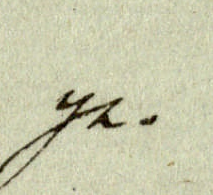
ge¬
